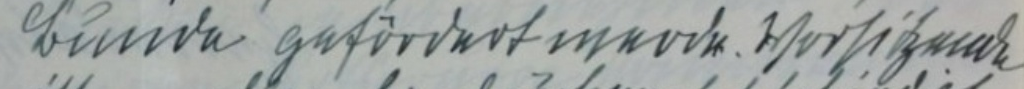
Bunde gefördert werde, Vorsitzende
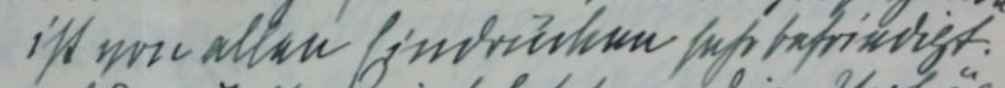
ist von allen Eindrücken sehr befriedigt.
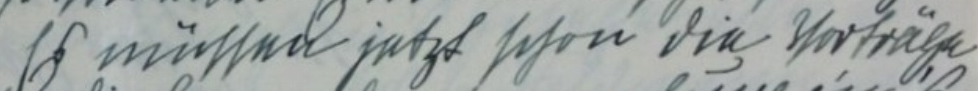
Es müssen jetzt schon die Vorträge
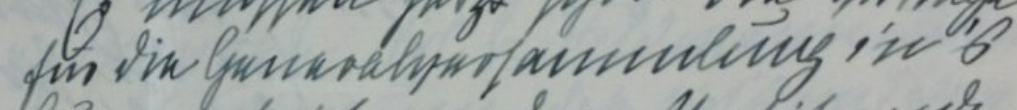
fpr die Generalversammlung in's
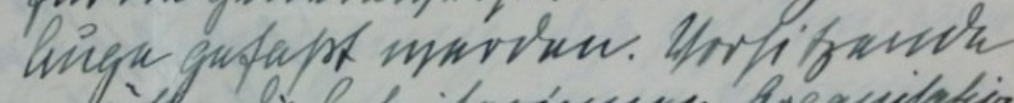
Auge gefaßt werden. Vorsitzende
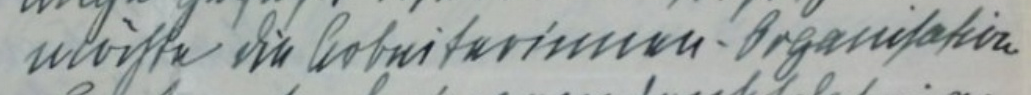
möchte die Arbeiterinnen-Organisation
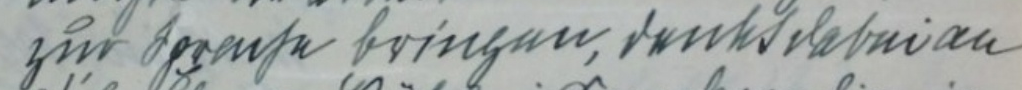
zur Sprache bringen denkt dabei an
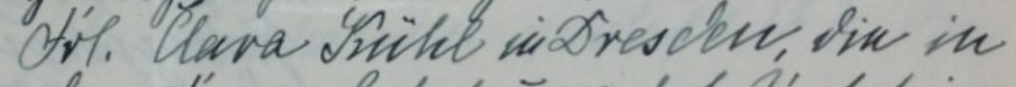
Frl. Clara Kühl in Dresden, die in
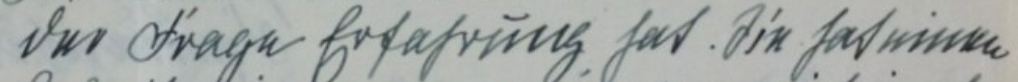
der Frage Erfahrung hat. Die Sie hat einen
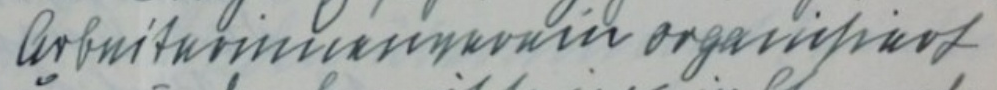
Arbeiterinnenverein organisiert
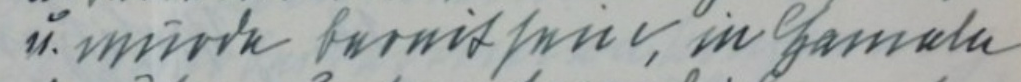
u. würde bereit sein, in Hameln
